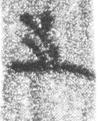之
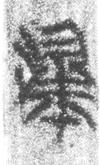○（寢）
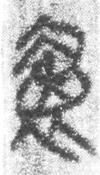裀（絪）
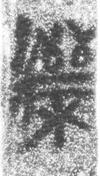○（縉）
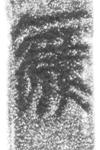綠
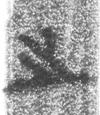之
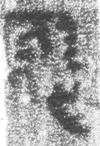裏
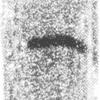一
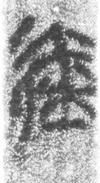○（錦）
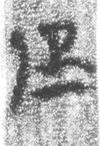坐
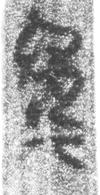裀（絪）
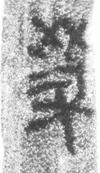○（縉）
